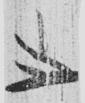之
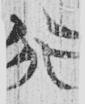行
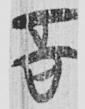言
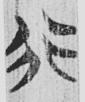行
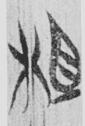相
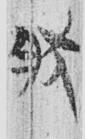肰（然）
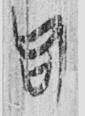句（後）
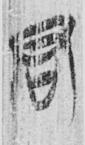君
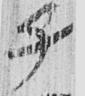子
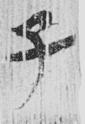子
